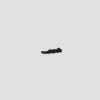一
